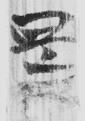是
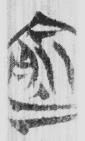{俞止}
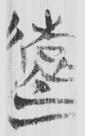遠
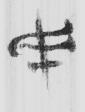民
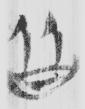皆
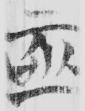亟
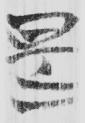是
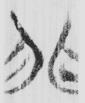非
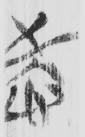㤅
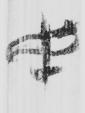民
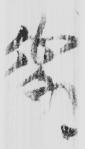虎
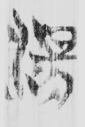湯
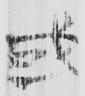或
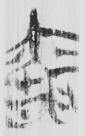{尒䎽}
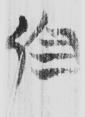於
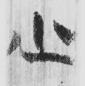少
